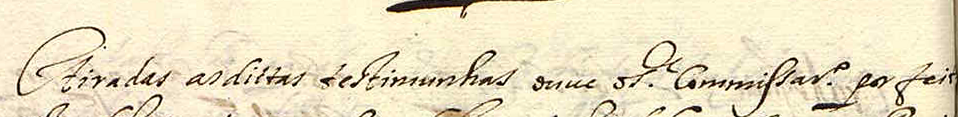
E tiradas as dittas testimunhas ouue o S.r Commissar.o por feit
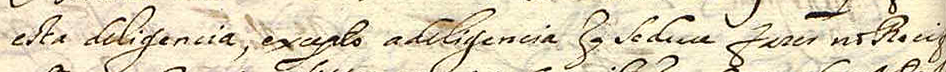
esta deligencia, excepto a deligencia q̄ se deue fazer no Recif
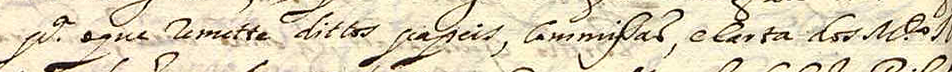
p.a o que remette dittos papeis, Commissaõ, e Carta dos M.to I
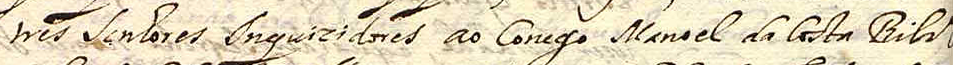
tres Senhores Inquizidores ao Conego Manoel da Costa Ribro
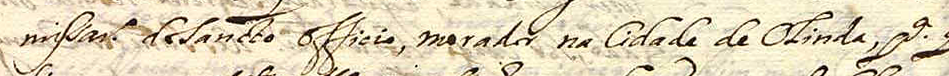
missar.o do Sancto officio, morador na Cidade de Olinda, p.a q̄
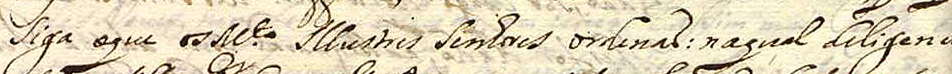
siga o que os M.to Illustres Senhores ordenaõ: na qual deligenci
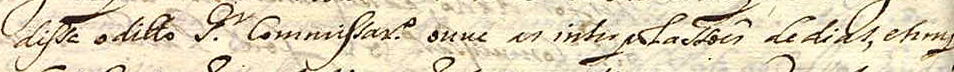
disse o ditto S.or Commissar.o ouue as interpoLassoẽs de dias, e temp
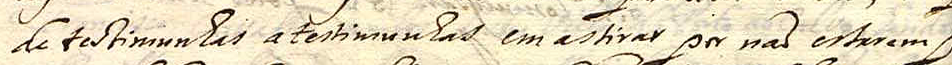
de testimunhas a testimunhas em as tirar por naõ estarem j
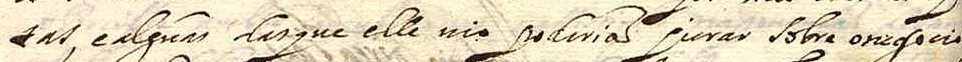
tas, e alguās das que elle uio poderiaõ jurar sobre o negocio
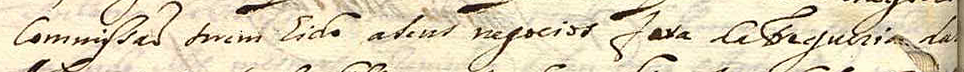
commissaõ terem hido a seus negocios fora da Freguezia das
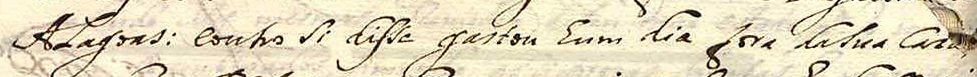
ALagoas: e outrosi disse gastou hum dia fora da sua Caza
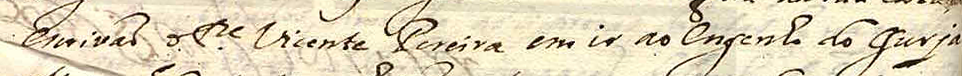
Escrivaõ o P.e Vicente Pereira em ir ao Engenho do Gurja
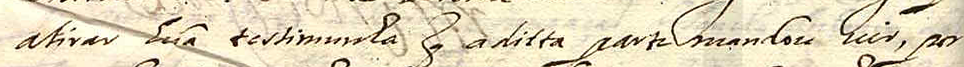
a tirar huā testimunha q̄ a ditta parte mandou uir, por
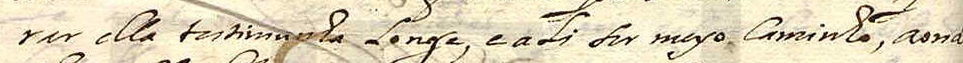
rar ella testimunha Longe, e ali ser meyo Caminho, aond
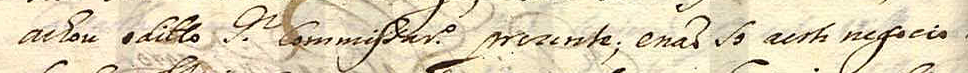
achou o ditto S.r Commissar.o prezente; e naõ só a este negocio
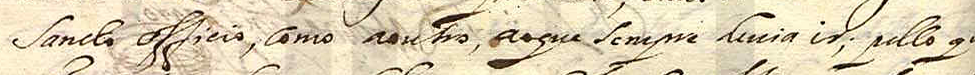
Sancto officio, como a outros, ao que sempre deuia ir; pello q̄
